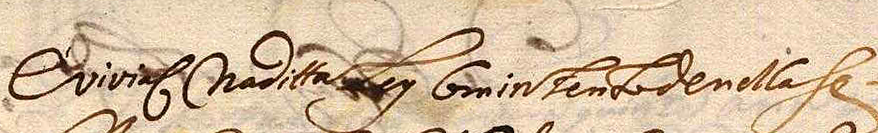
E viviaõ na ditta Ley Com intento de nella se
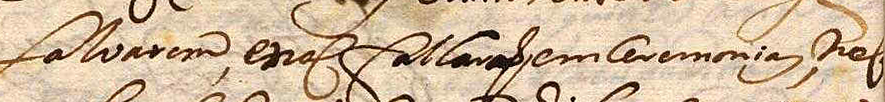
salvarem, e naõ fallaraõ em ceremonias, nē
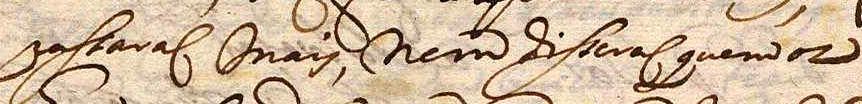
passaraõ mais, nem disseraõ quem os
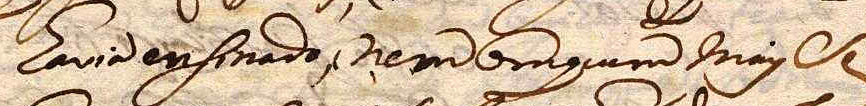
havia ensinado, nem Com quem mais Se
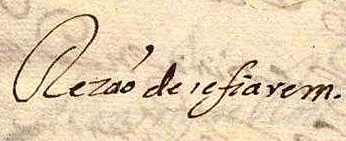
Rezaõ de se fiarem.
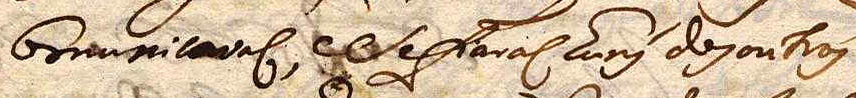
Comunicavaõ, e se fiaraõ huns̄ dos outros
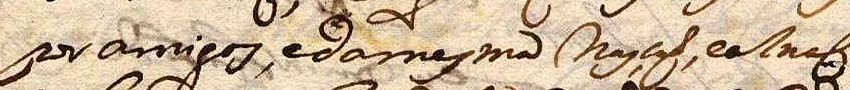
por amigos, e da mesma Nasçaõ, e al naõ
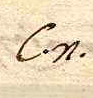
C.n.
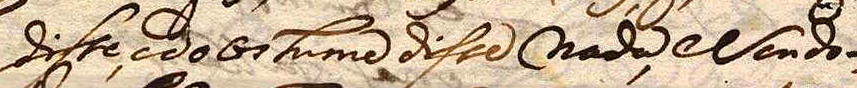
disse, e do costume disse nada, e Sendo
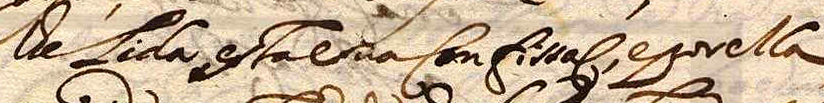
lhe Lida esta sua Confissaõ, e por ella
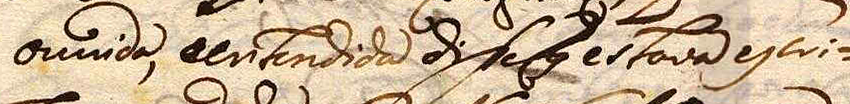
ouuida, e entendida dise q̄ estava escri
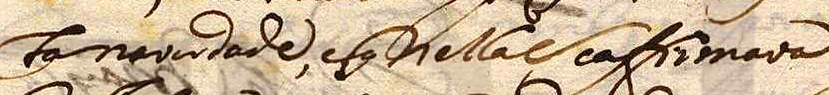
ta na verdade, e q̄ nella Se affirmava
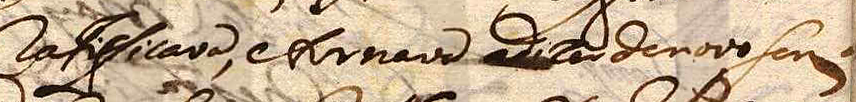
Ratificava, e tornava a dizer de novo sen
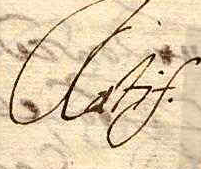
Ratif.
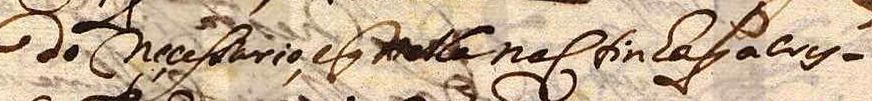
do necessario, e q̄ nella naõ tinha q̄ acres
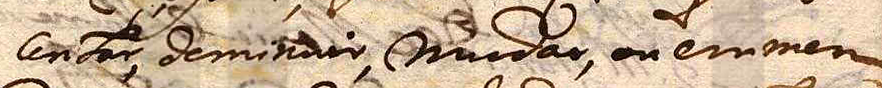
centar, deminuir, mundar, ou emmen
